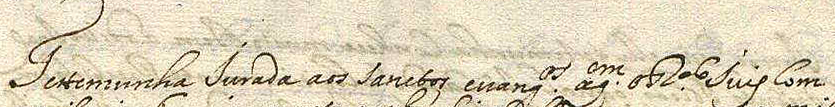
Testemunha Jurada aos Sanctos euang.os a q.em o R.do Iuis Com
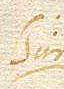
Iur
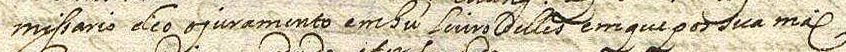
missario deo o juramento em hū liuro delles em que pos sua maõ,
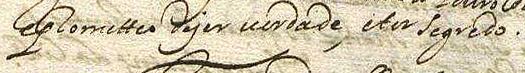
e prometteo dizer uerdade, e ter segredo.
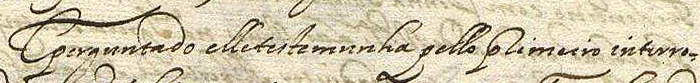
E perguntado elle testemunha pello primeiro interro
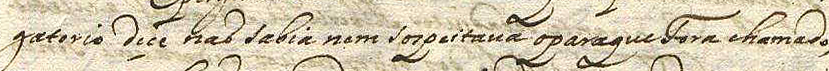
gatorio dice naõ sabia nem sospeitaua o para que Fora chamado,
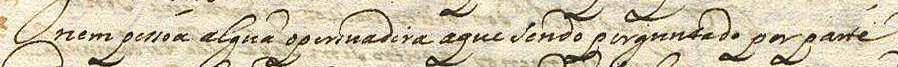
nem pessoa alguā o persuadira a que sendo perguntado por parte
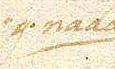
g. nada
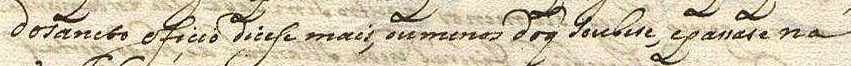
do sancto oficio dicese mais, ou menos do q̄ soubese, e passase na
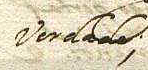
verdade;
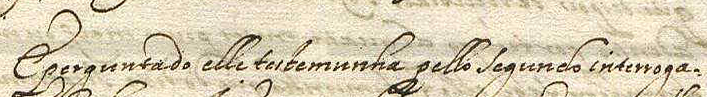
E perguntado elle testemunha pello segundo interroga
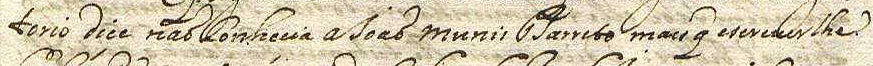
torio dice naõ Conhecia a Ioaõ munis Barreto mais q̄ escreuer lhe
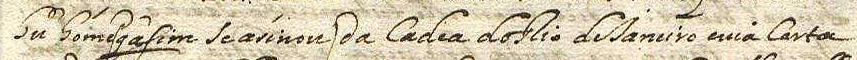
hū homē (q̄ asim se asinou) da Cadea do Rio de Ianeiro cuia Carta
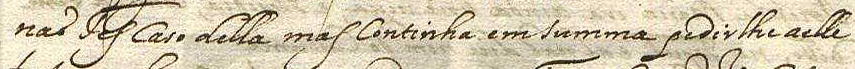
naõ Fes Caso della mas Continha em summa pedirlhe a elle
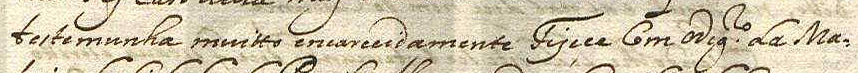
testemunha muitto encarecidamente Fizece Com o vig.ro da Ma
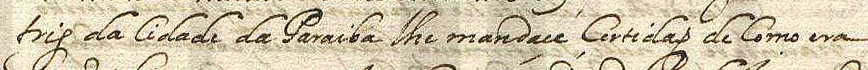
tris da Cidade da Paraiba lhe mandace Certidaõ de Como era
